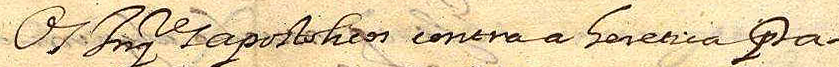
Os Jnqres apostolicos contra a heretica pra
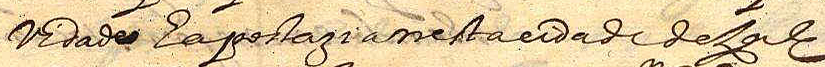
vidade E apostazia nesta cidade de Lxa E
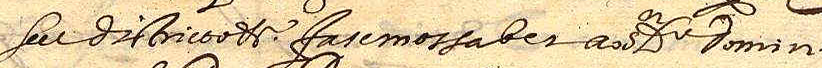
seu districto etc. fasemos saber ao Sr Lo Domin
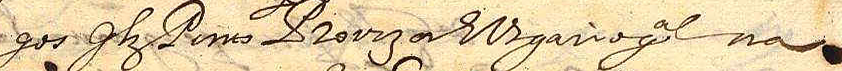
gos glz Ponte Provizor E Vigario gal na
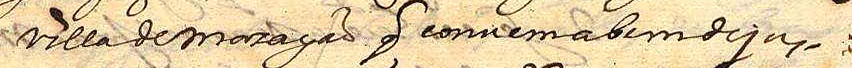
villa de mazagaõ q̄ conuem a bem de jus
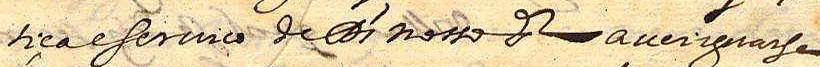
tiça e serviço de Ds̄ nosso Sr aueriguarse
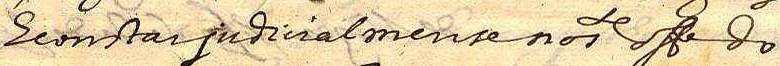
E constar judicialmente no sto offo do
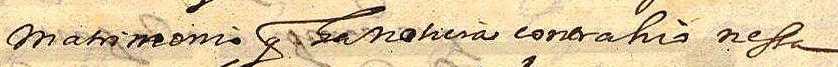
matrimonio q̄ ha noticia contrahia nessa
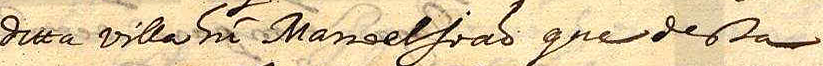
ditta villa hū Manoel Joaõ que desta
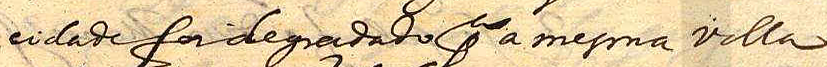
cidade foi degradado pa a mesma villa
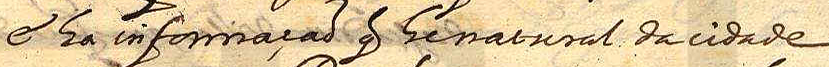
e ha informaçaõ q̄ he natural da cidade
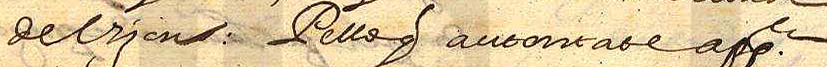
de Uizeu: Pello q̄ autoritate app.ca
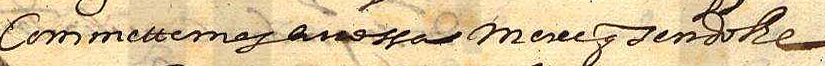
Commettemos a nossa merce q̄ sendolhe
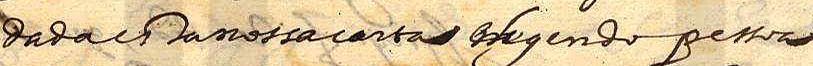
dada esta nossa carta elegendo pessoa
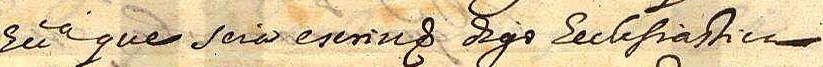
Eua que seia escrivão digo Ecclesiastica
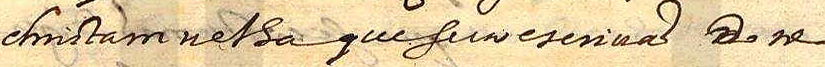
christam velha que seu escrivaõ no ne
